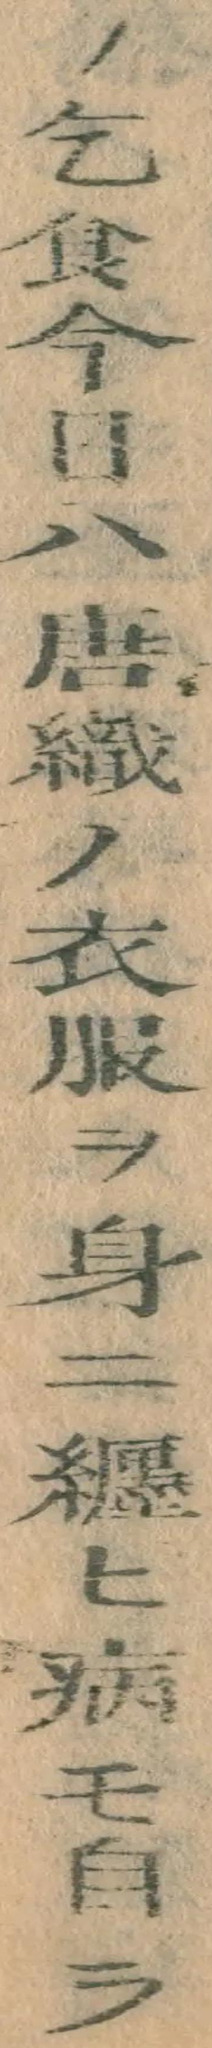ノ乞食今日ハ唐織ノ衣服ヲ身ニ纏ヒ病モ自ラ
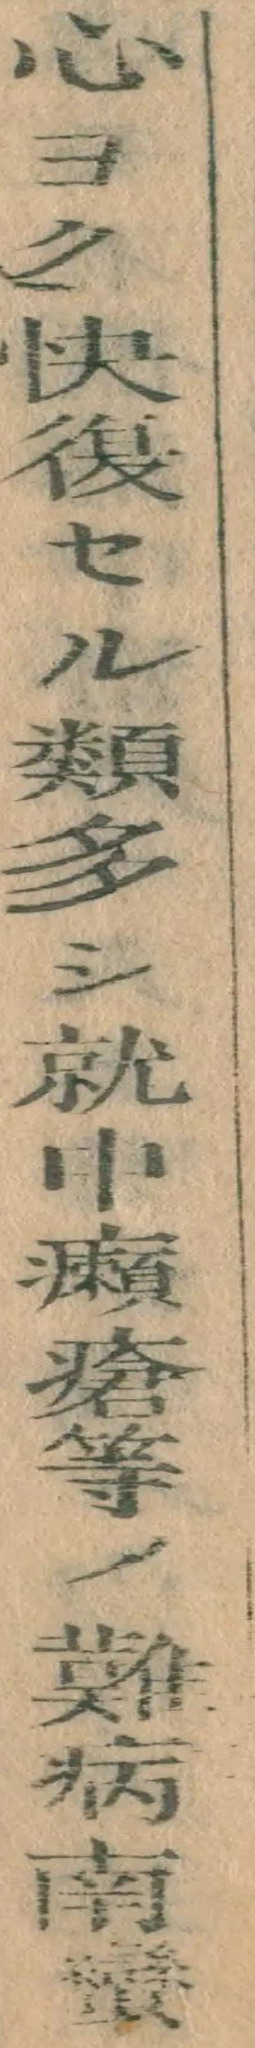心ヨク快復セル類多シ就中癩瘡等ノ難病南蛮
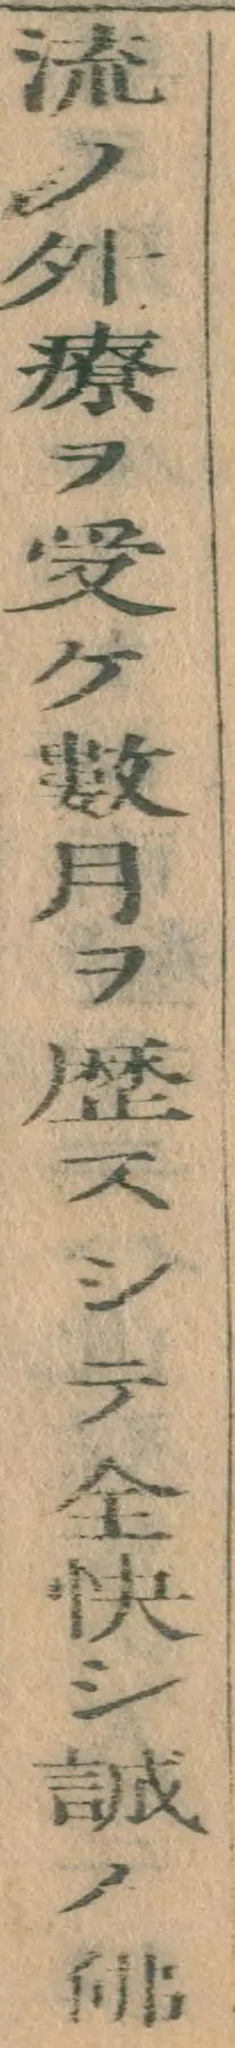流ノ外療ヲ受ケ数月ヲ歴スシテ全快シ誠ノ仏
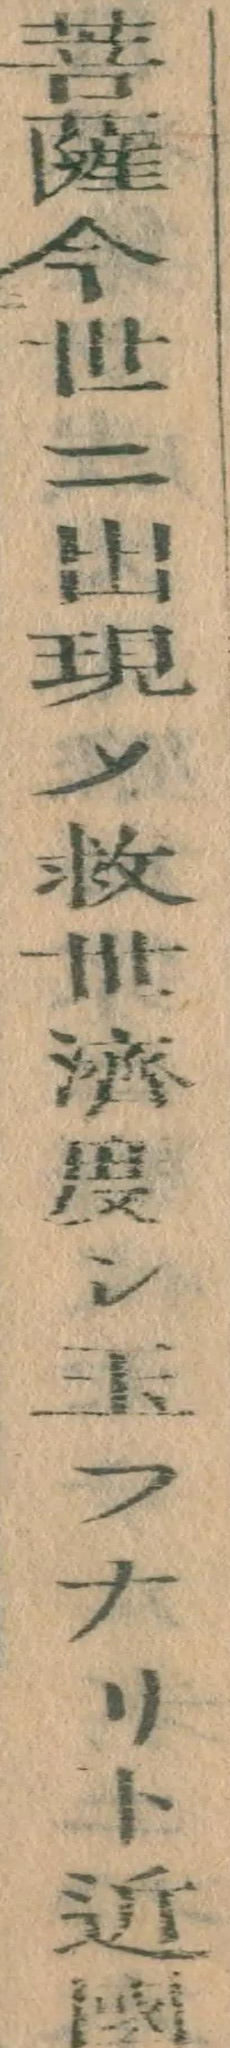菩薩今世ニ出現シテ救世済度シ玉フナリト近国
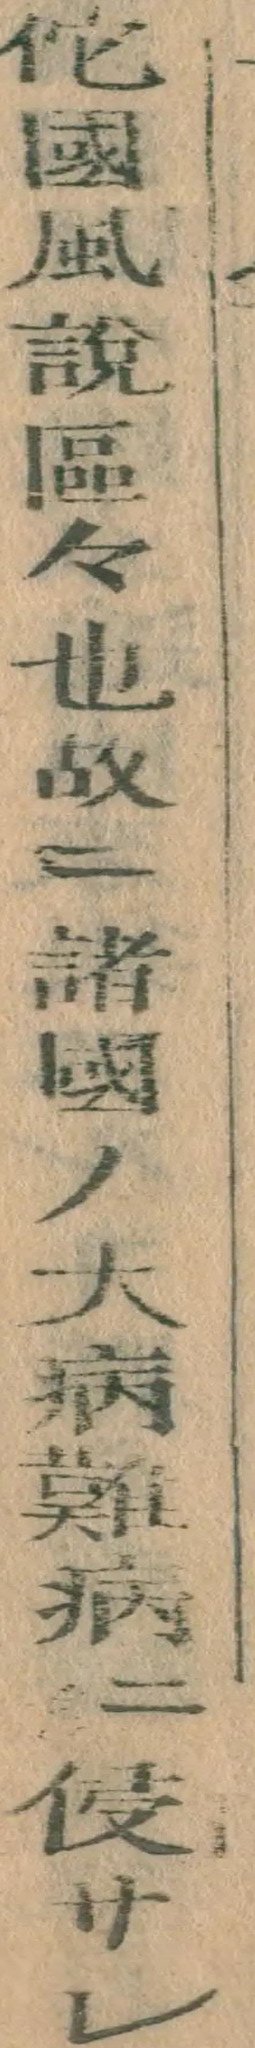佗国風説区々也故ニ諸国ノ大病難病ニ侵サレ
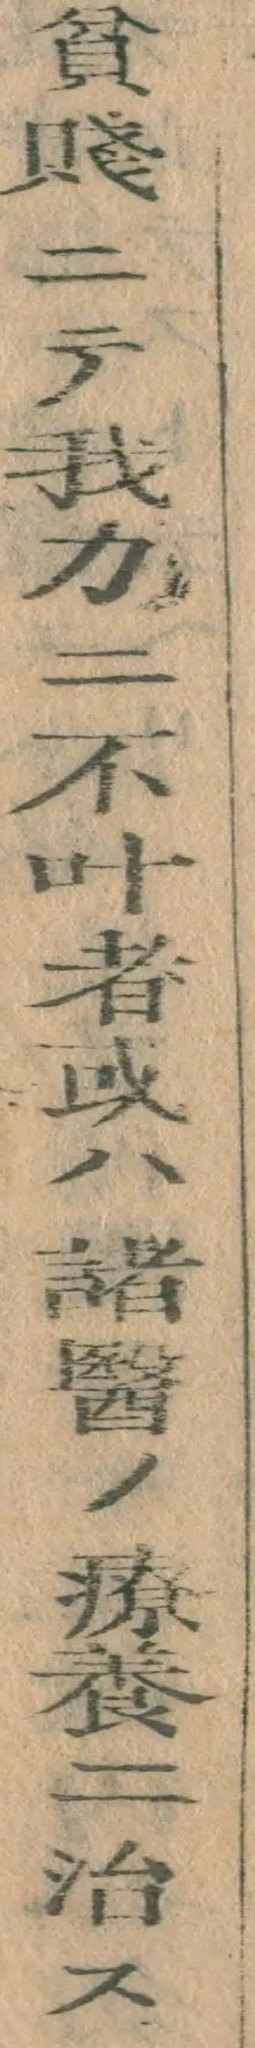貧賤ニテ我力ニ不叶者或ハ諸医ノ療養ニ治ス
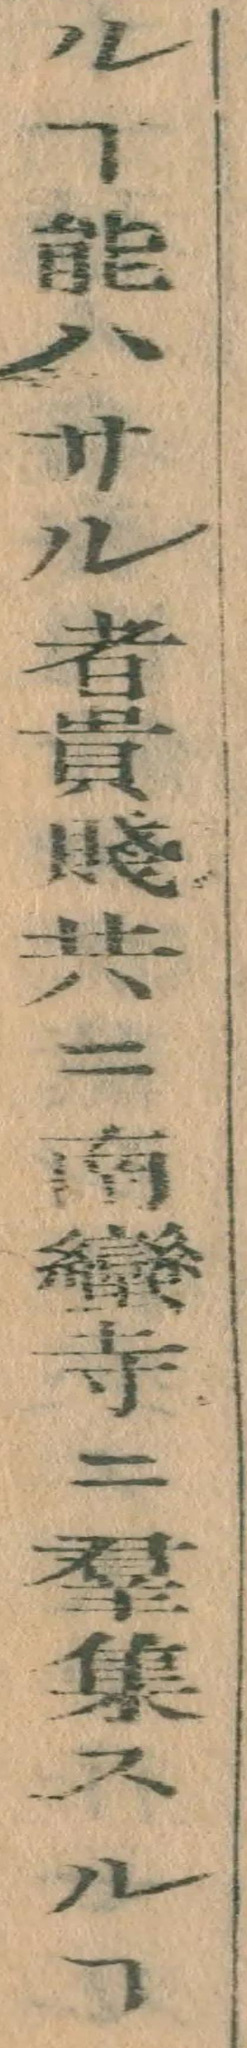ルヿ能ハサル者貴賤共ニ南蛮寺ニ群集スルヿ
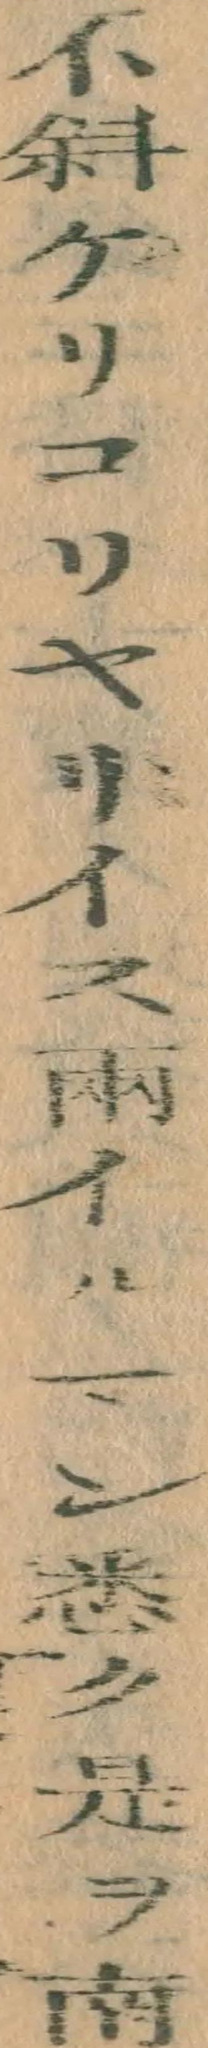不斜ケリコリヤリイス両イルマン悉ク之ヲ南
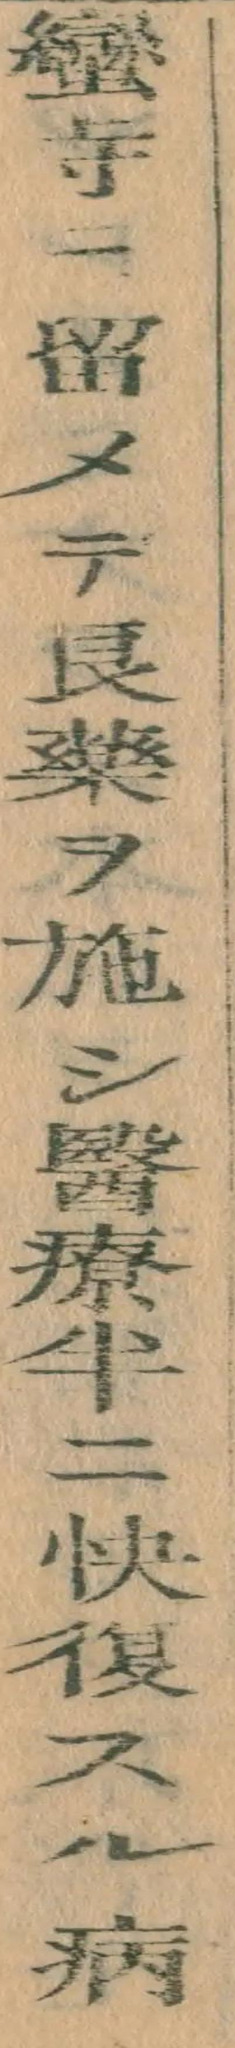蛮寺ニ留メテ良薬ヲ施シ医療半ニ快復スル病
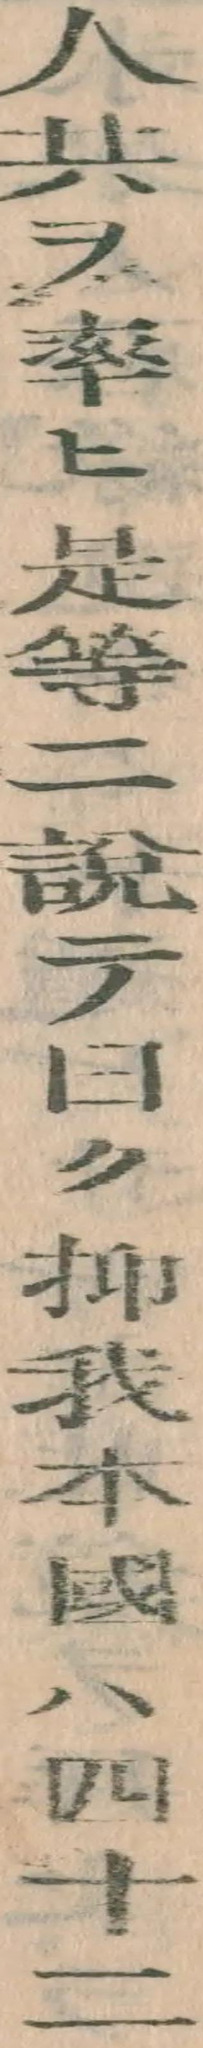人共ヲ率ヒ是等ニ説テ曰ク抑我本国ハ四十二
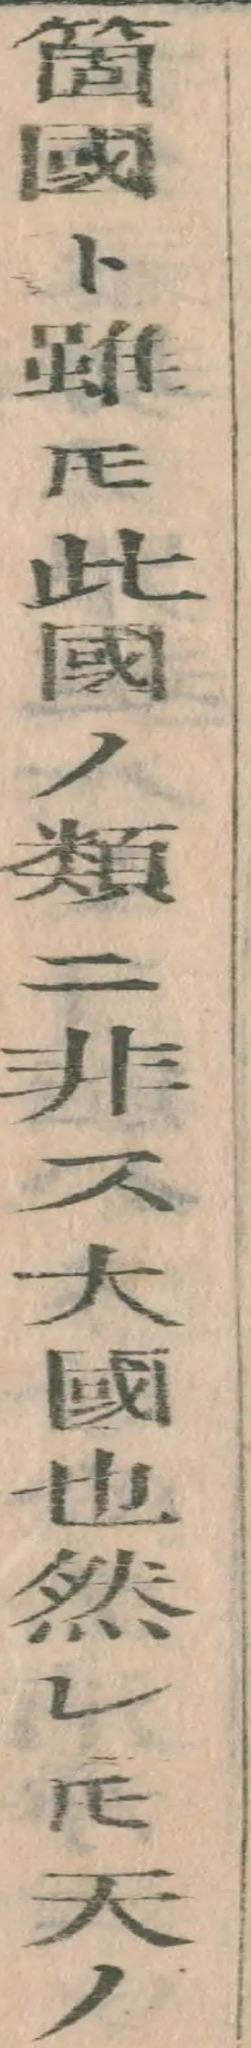箇国ト雖トモ此国ノ類ニ非ス大国也然レトモ天ノ
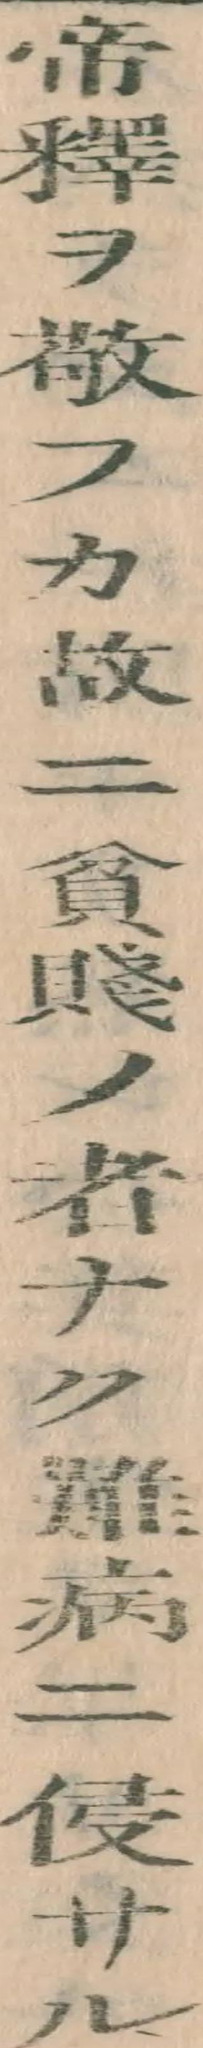帝釈ヲ敬フカ故ニ貧賤ノ者ナク難病ニ侵サル
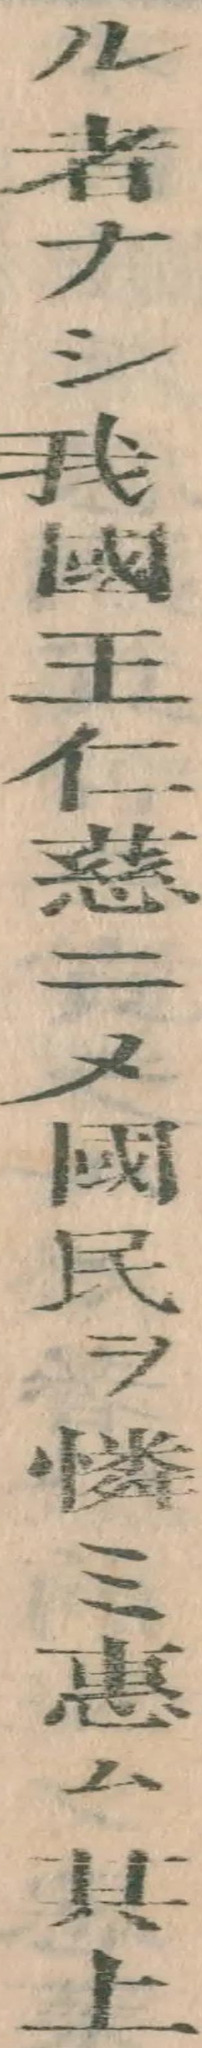ル者ナシ我国王仁慈ニシテ国民ヲ憐ミ恵ム其上
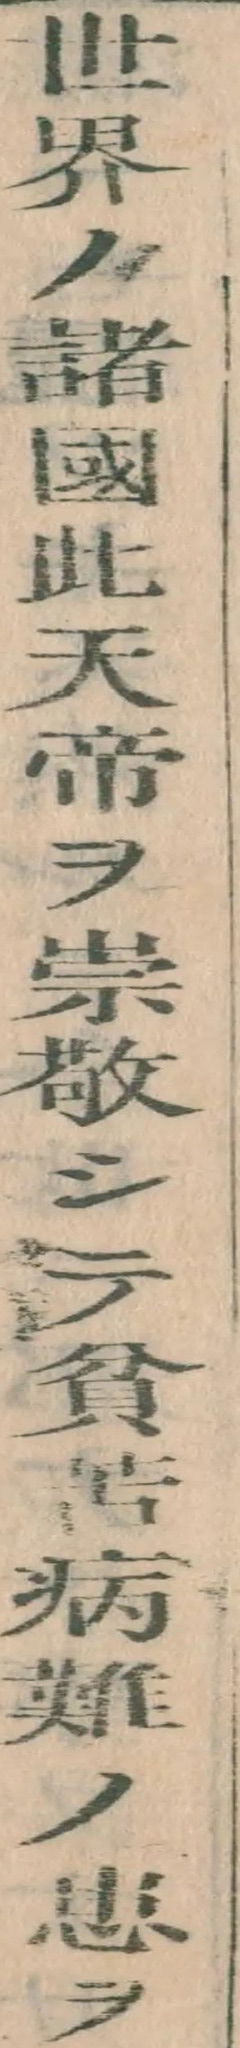世界ノ諸国此天帝ヲ崇敬シテ貧苦病難ノ患ヲ
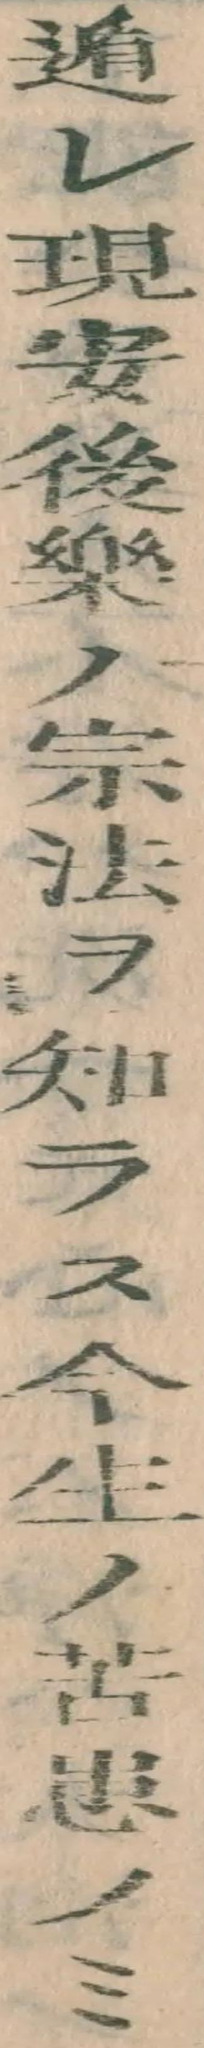遁レ現安後楽ノ宗法ヲ知ラス今生ノ苦患ノミ
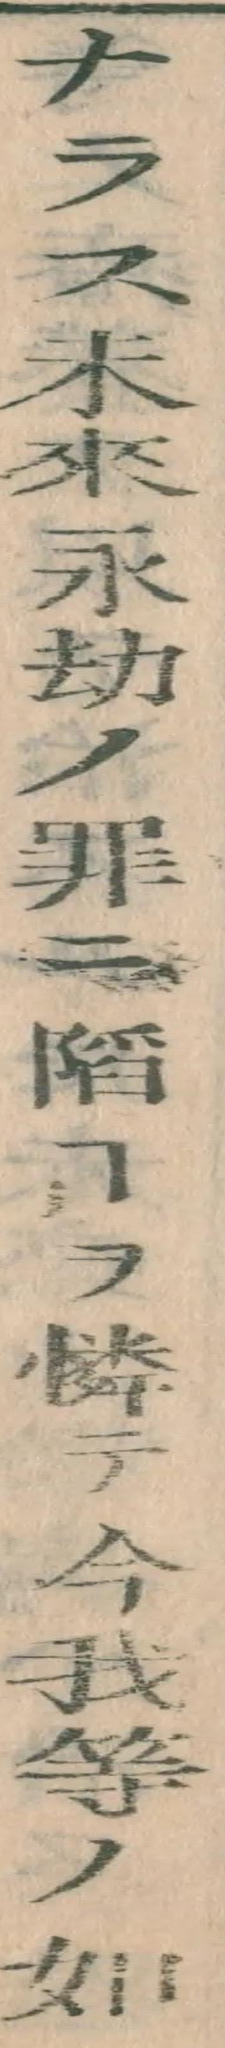ナラス未来永劫ノ罪ニ陥ヿヲ憐テ今我等ノ如
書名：南蛮寺興廃記
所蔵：国立国会図書館 National Diet Library, JAPAN
